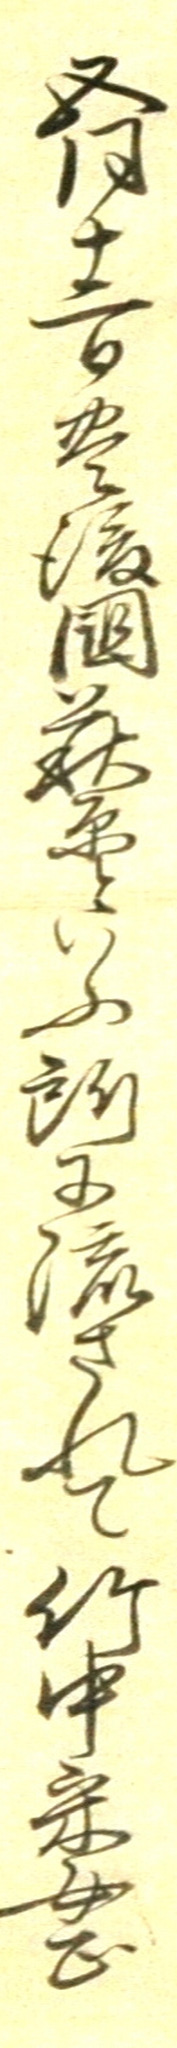五月十二日豊後国萩原といふ所に流されて竹中采女正
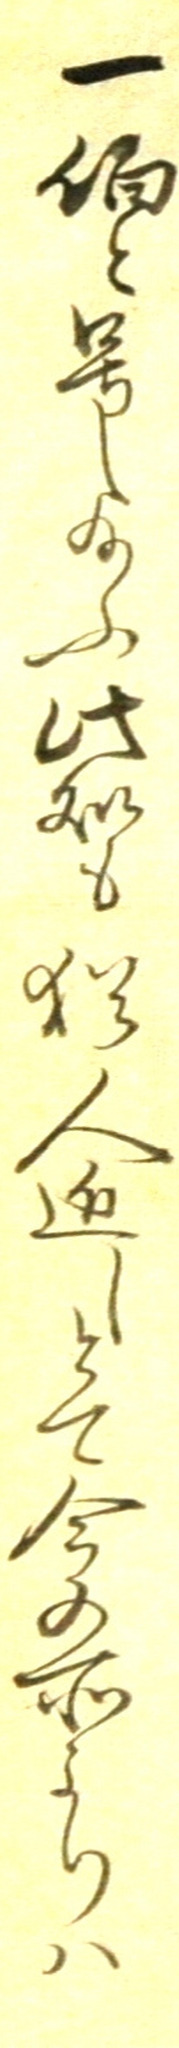一伯と号し給ふ此処も猶人近しとて今の所よりは

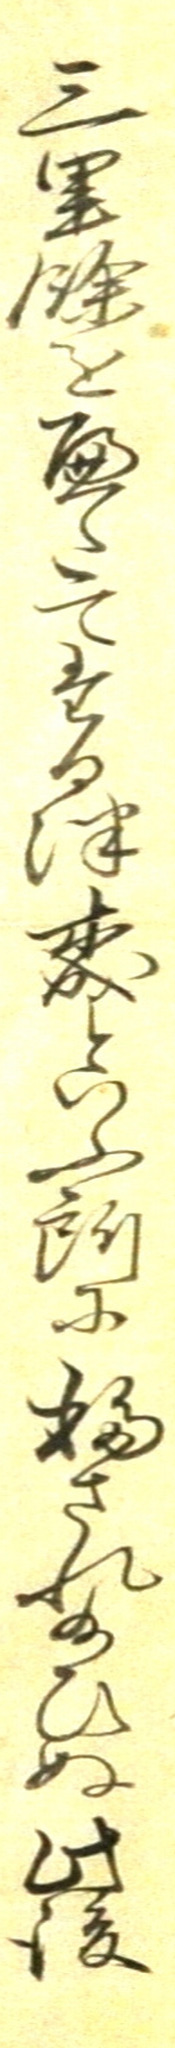三里余をへたてたる津森といふ所に移され給ひぬ此後
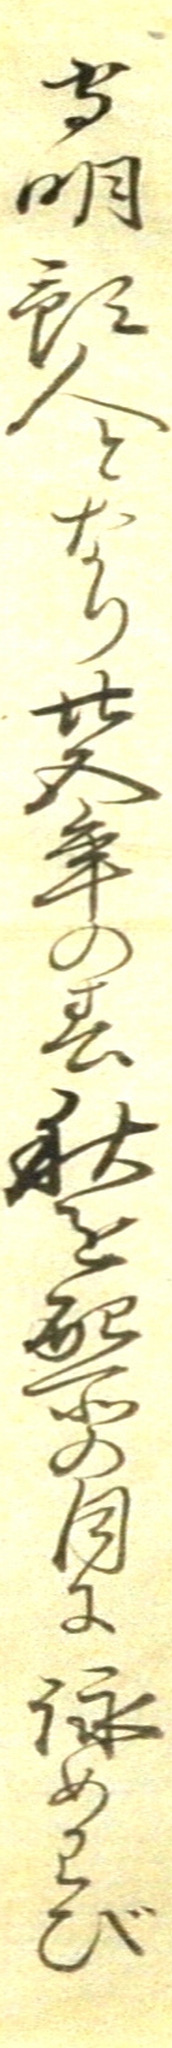守明預人となり廿五年の春秋を配所の月に詠めわび
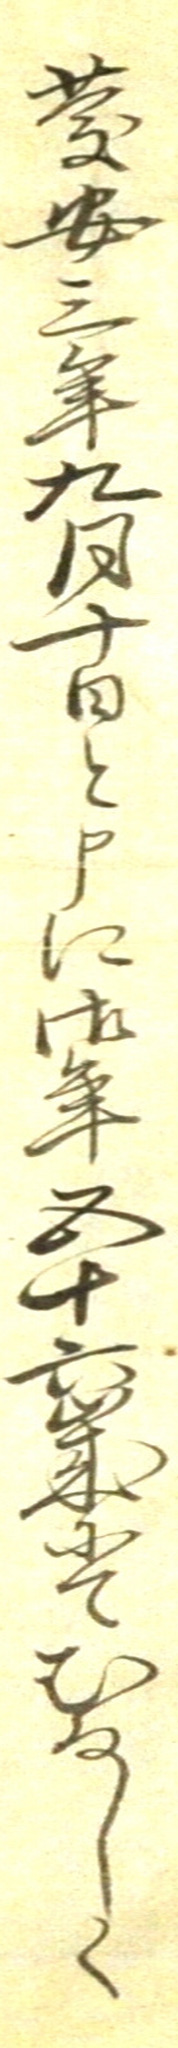慶安三年九月十日と申に御年五十六歳にてむなしく
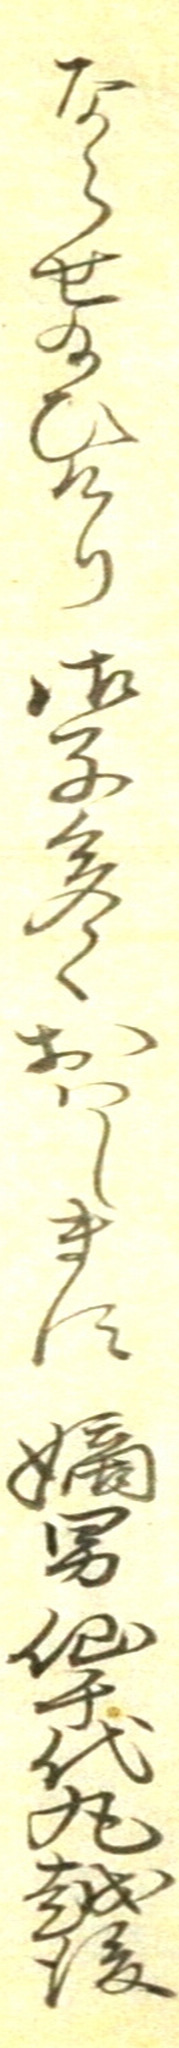ならせ給ひけり御子多くおはします嫡男仙千代丸越後
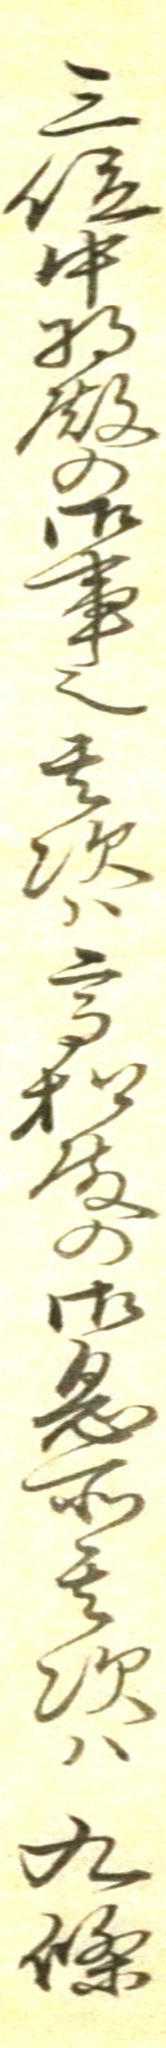三位中将殿の御事也其次は高松殿の御息所其次は九条
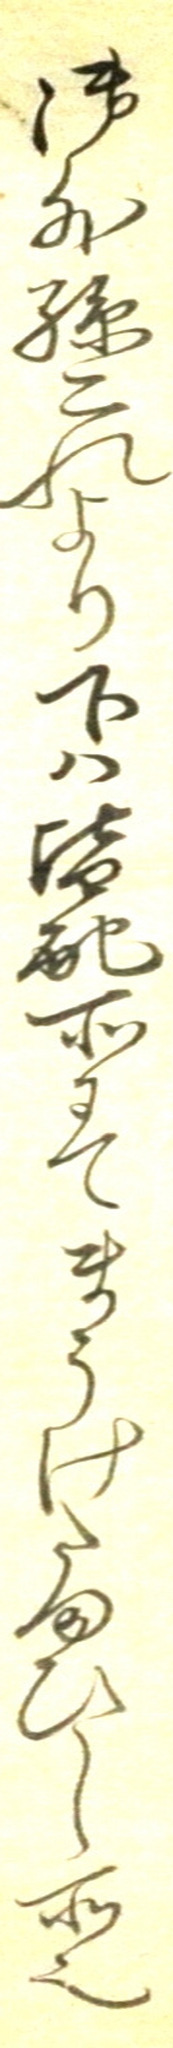御外孫これより下は皆配所にてまうけたまひし所也
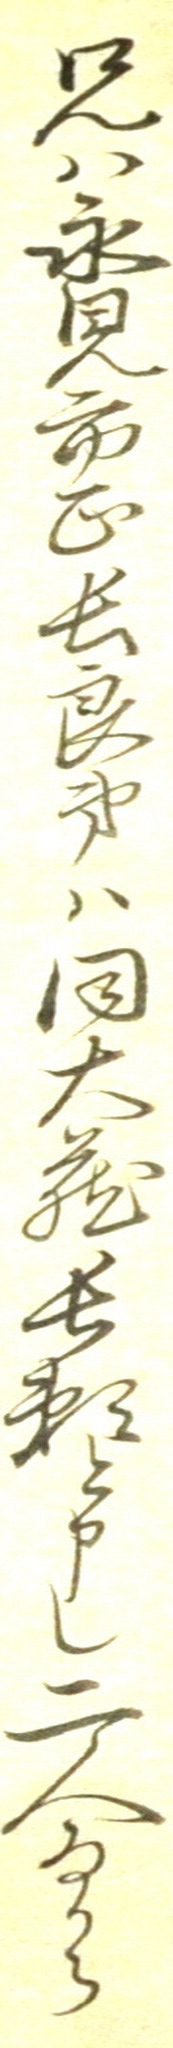兄は永見市正長良弟は同大蔵長頼と申し二人なから
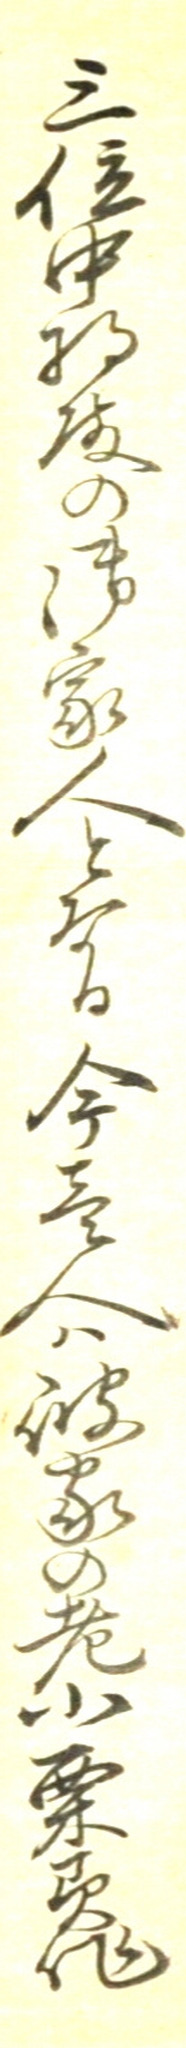三位中将殿の御家人となる今壱人は彼家の老小栗美作
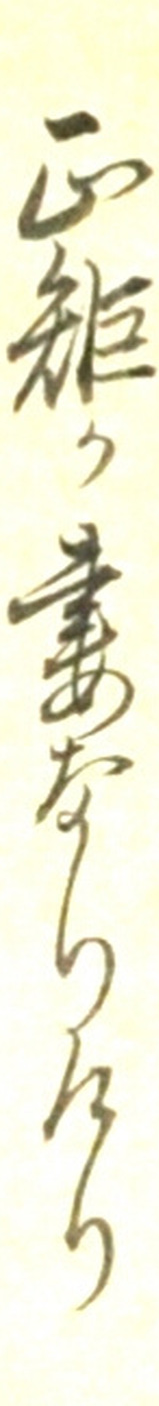正矩か妻なりけり
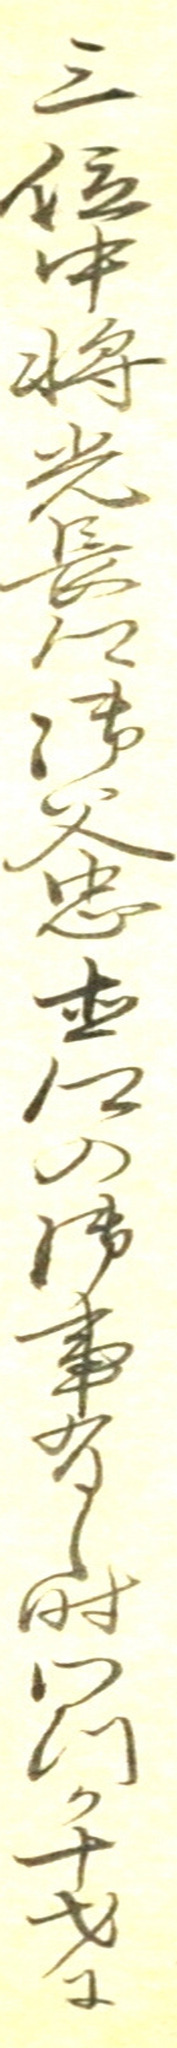三位中将光長卿御父忠直卿の御事有し時わつか十才に
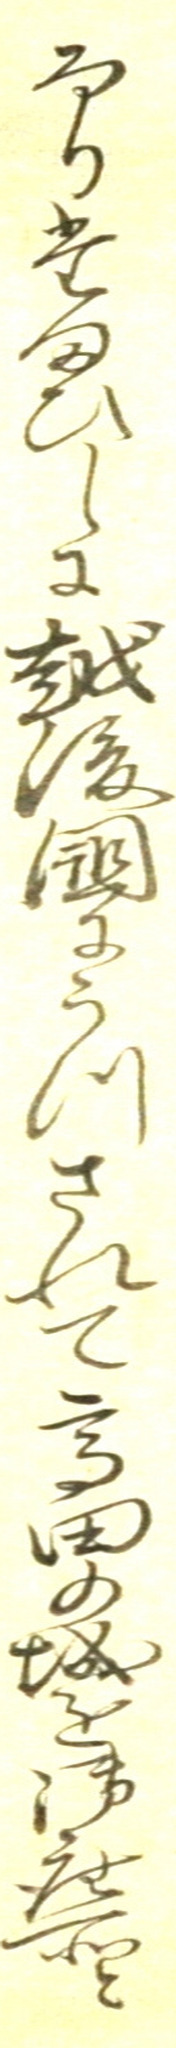なりたまひしに越後国にうつされて高田の城を御座所と
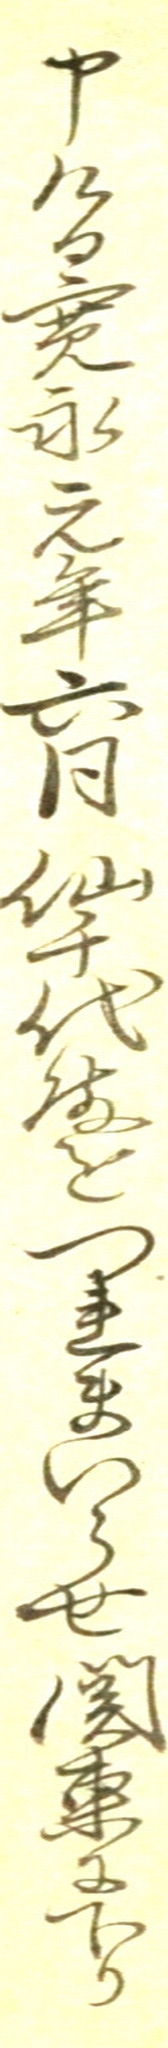申ける寛永元年六月仙千代殿をつれまいらせ関東に下り
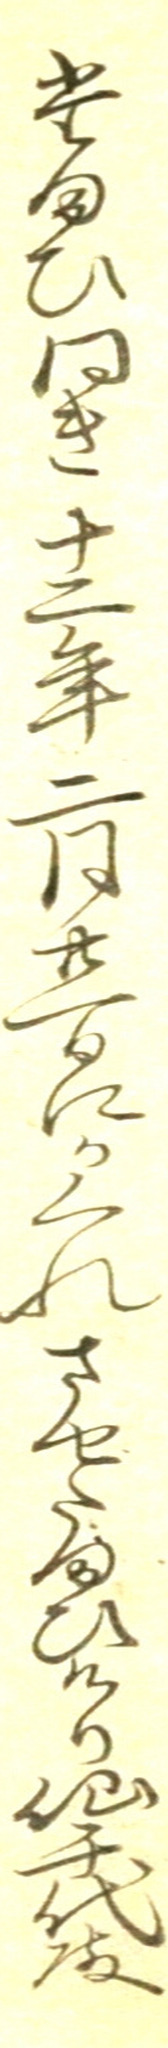たまひ同き十二年二月廿一日にかくれさせたまひけり仙千代殿
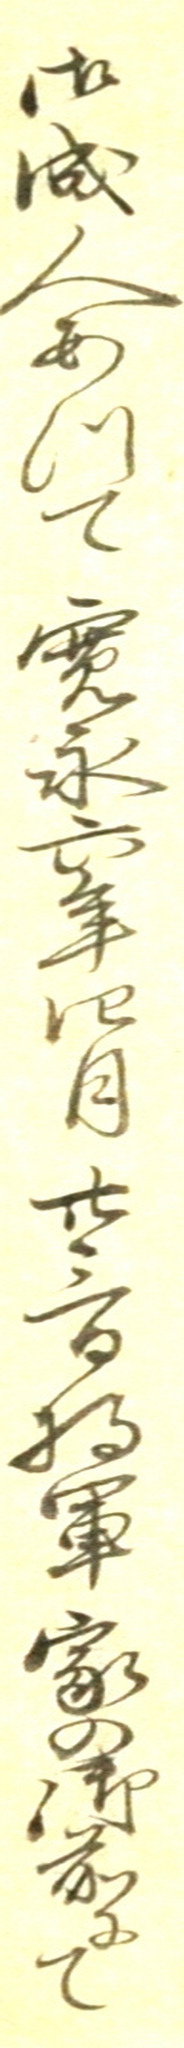御成人あつて寛永六年四月廿三日将軍家の御前にて
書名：藩翰譜（一）
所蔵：伊那市立高遠町図書館・合同会社AMANE
